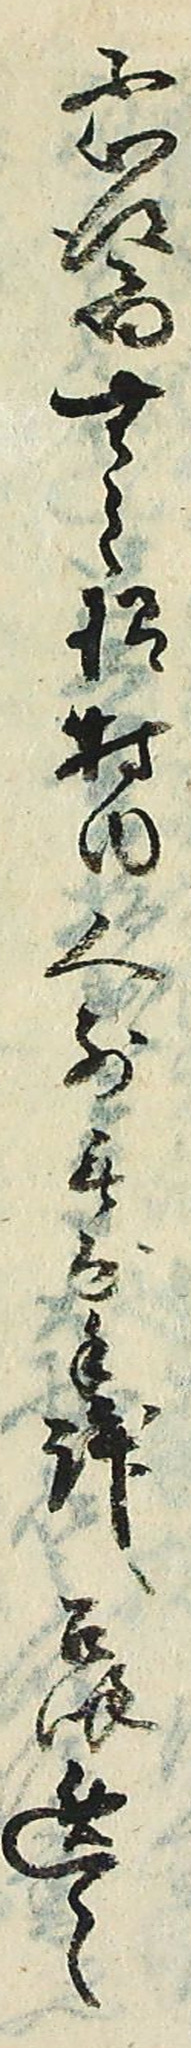不心得者無之様村内人別無分手許へ召呼逸々
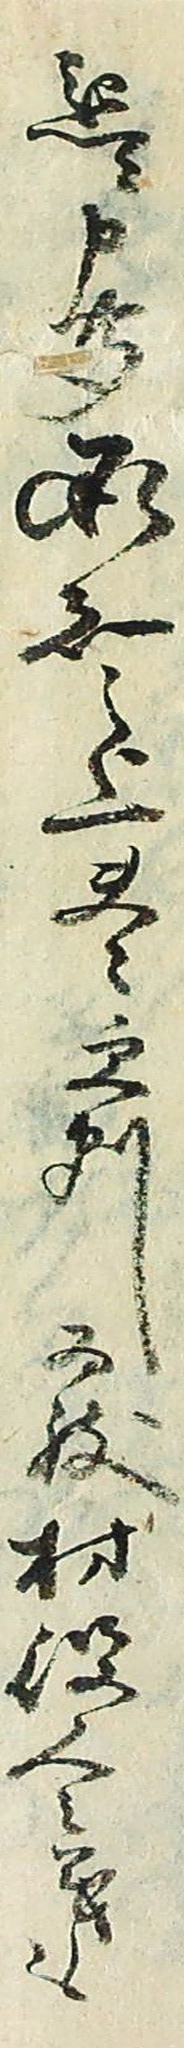懇に申聞承知之上夫々受判為致村役人之義も
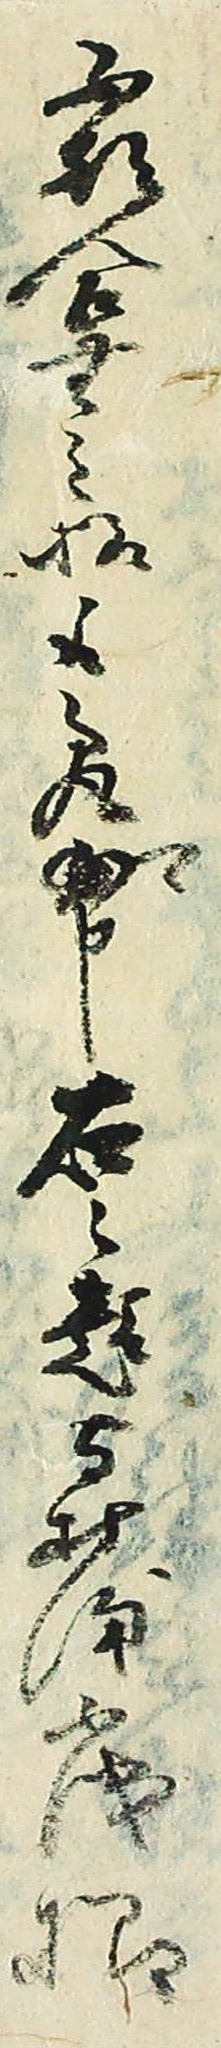不都合無之様取究可申右の趣与村浦不洩様
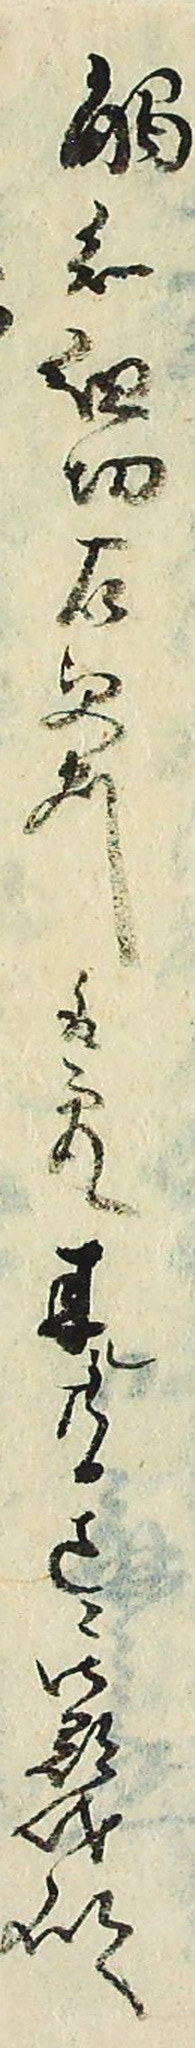触知組切右受判取究来る廿日迄に御郡代処へ
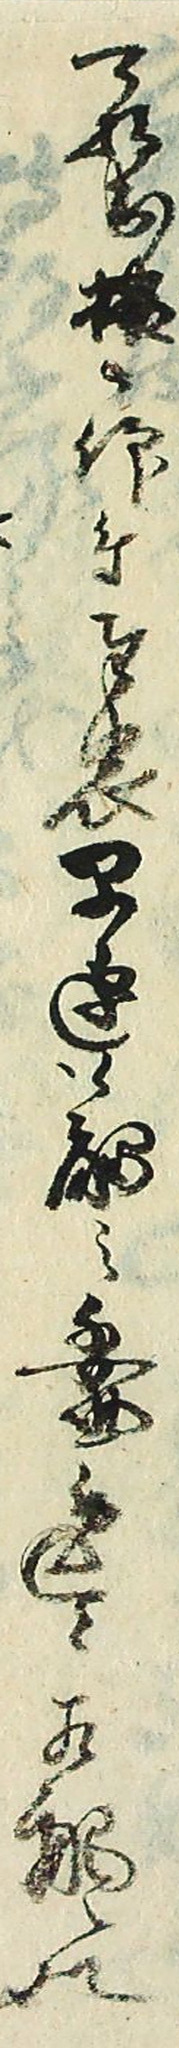可指出旨被仰付奉畏早速御触之委曲逸々相触候処
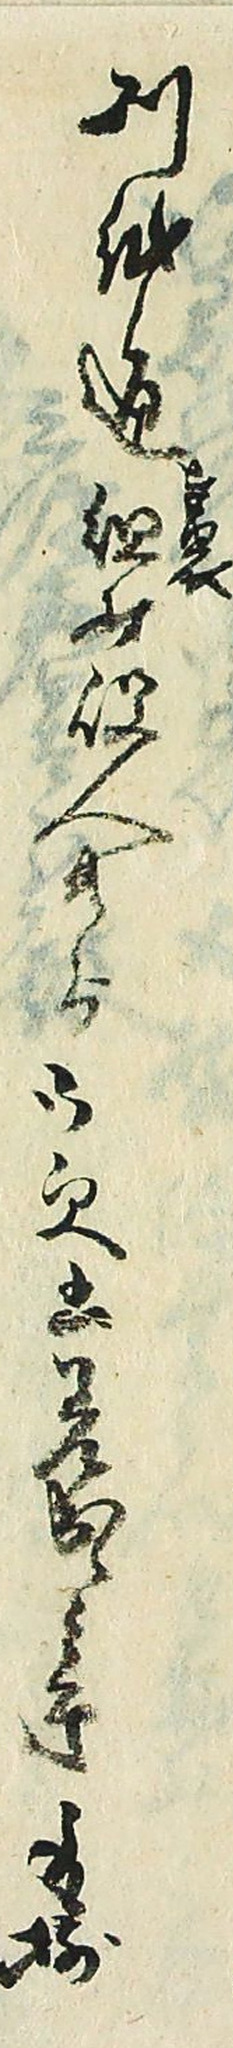別紙之通奉畏組村役人共ゟ御受書差出候に付取揃
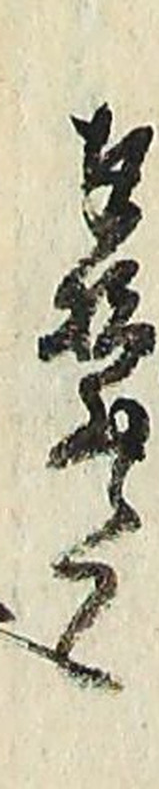奉指上候以上
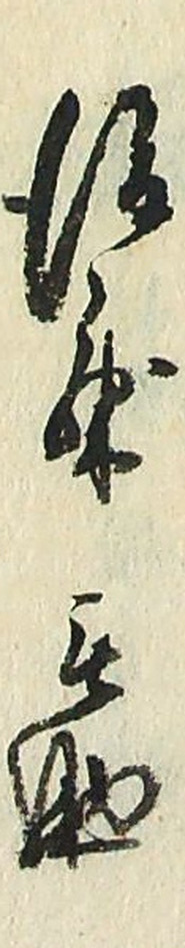後藤庄助
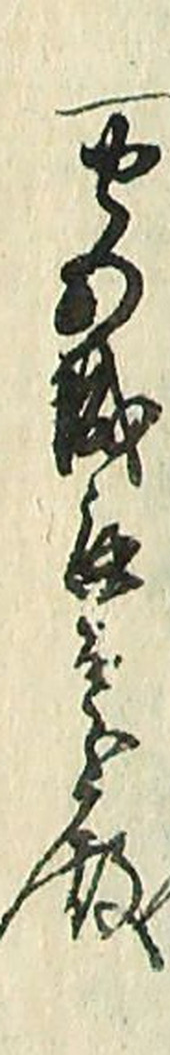宮城麻太郎殿

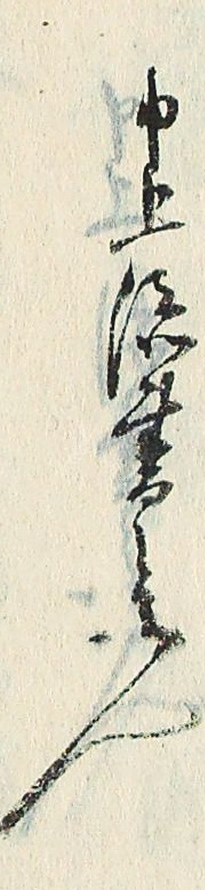申上添書之覚
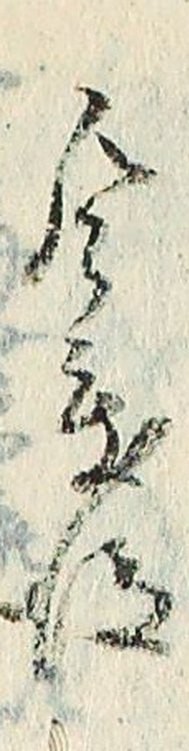今度従
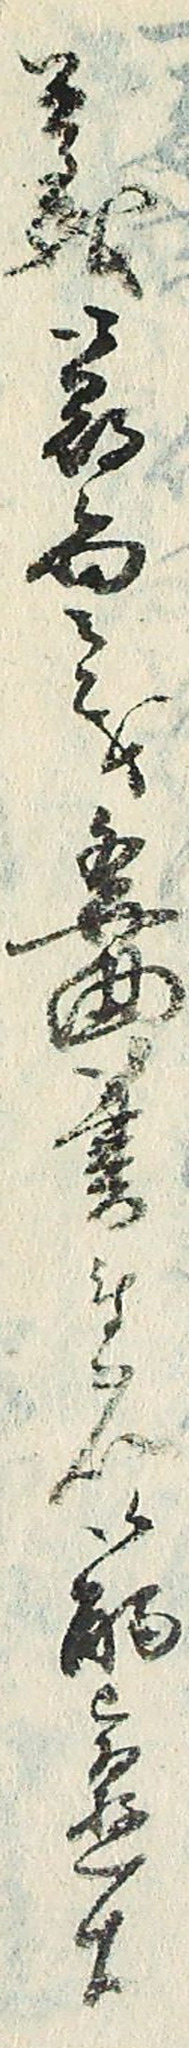公義御尋者之義委曲御書付を以御触被為遊候
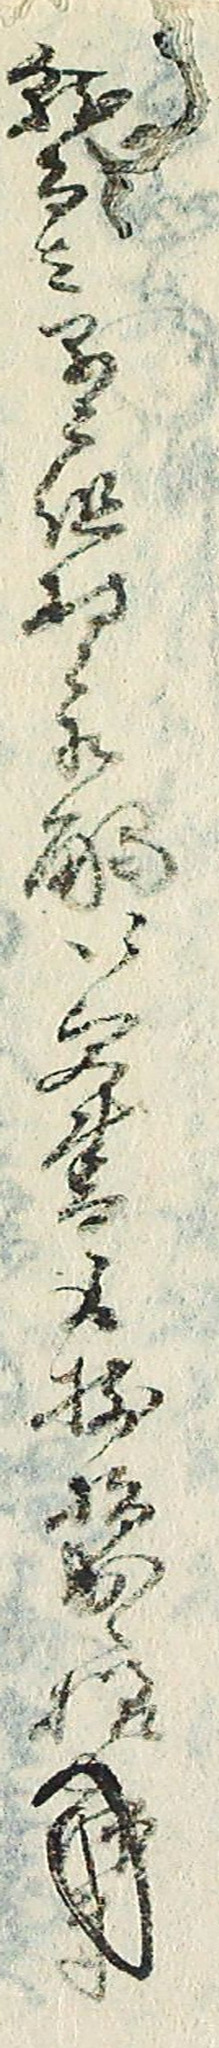就而は早々組村々相触御受書取揃指出候様
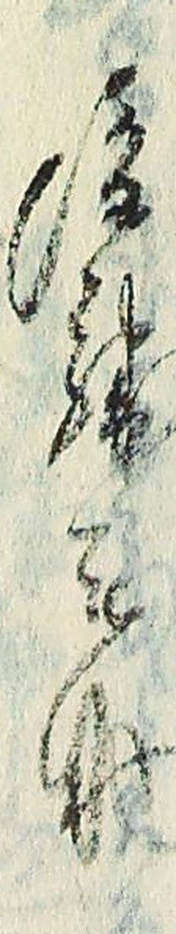後藤庄助
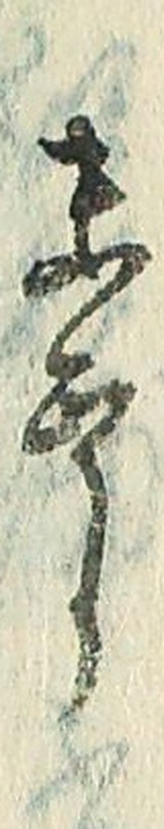未正月
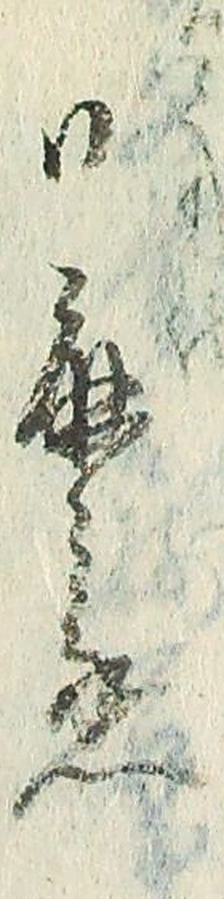同麻之丞
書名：諸御用御□受書控
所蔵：鳴門教育大学 Naruto University of Education
